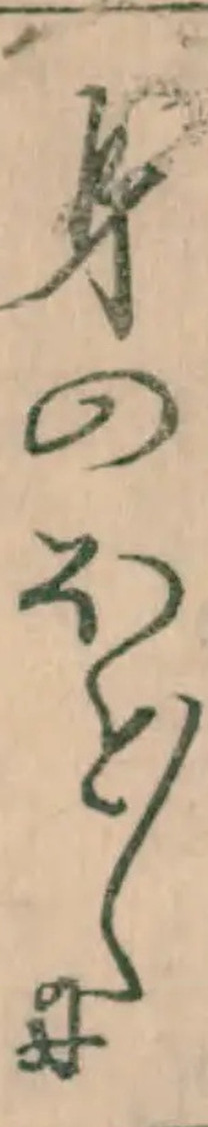みのほと〳〵に
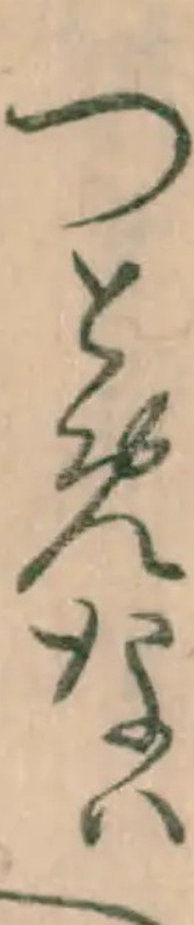つとめなは
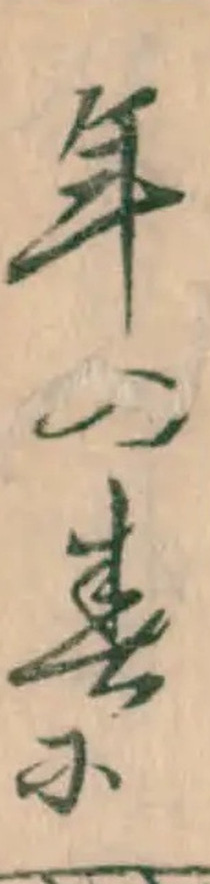年の春に
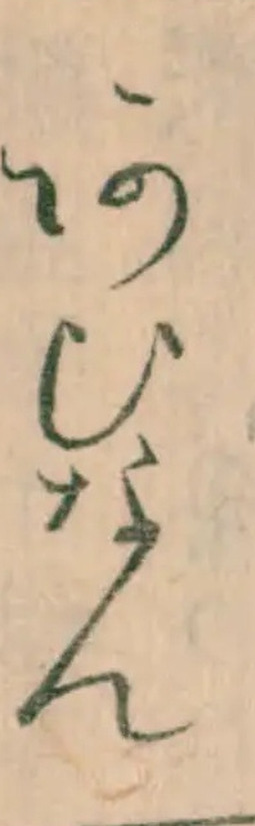あひなん
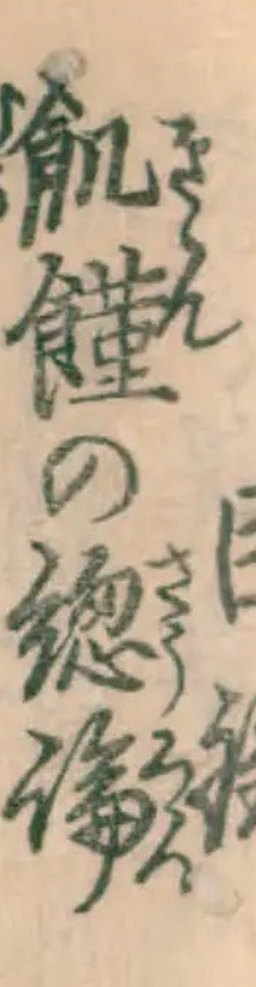飢饉の総論
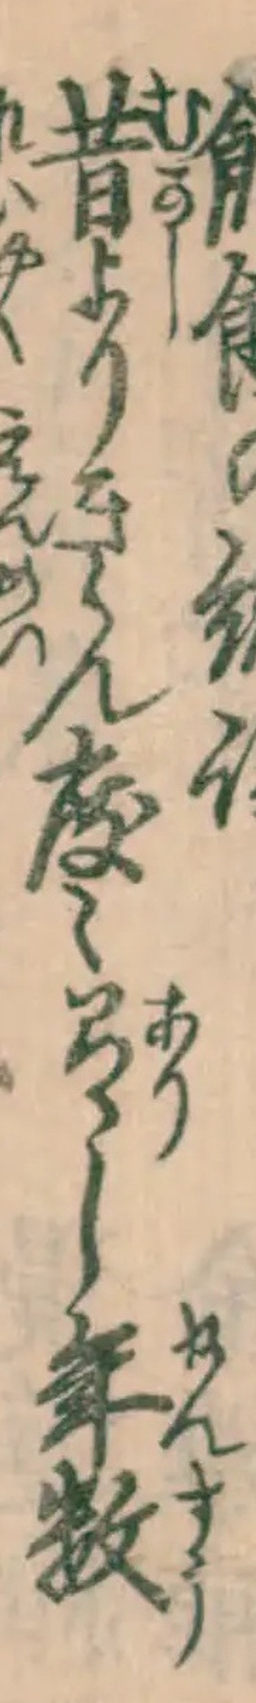昔よりきゝん度々有し年数
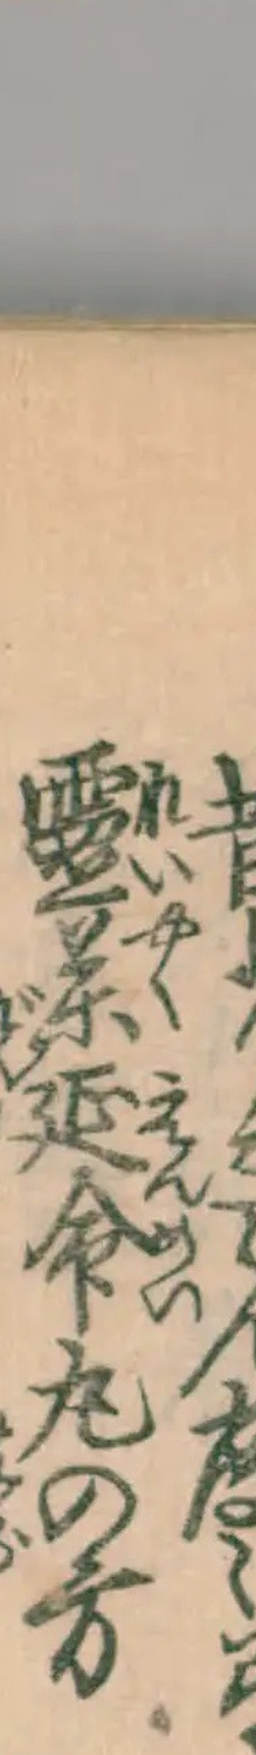霊薬延命丸の方
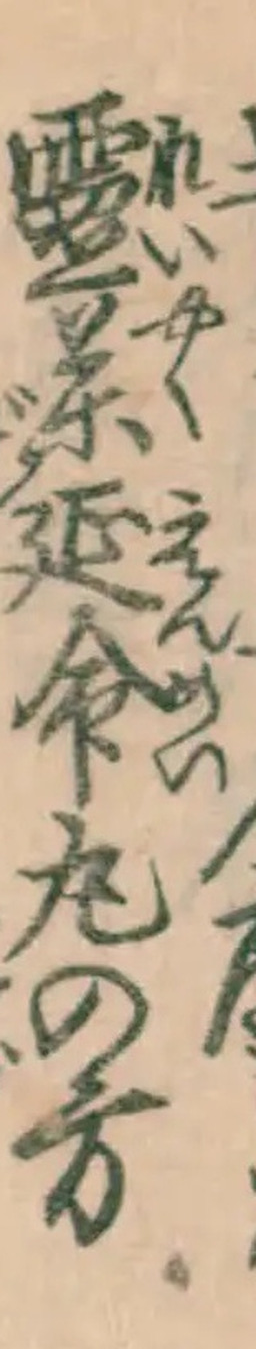霊薬延命丸の方
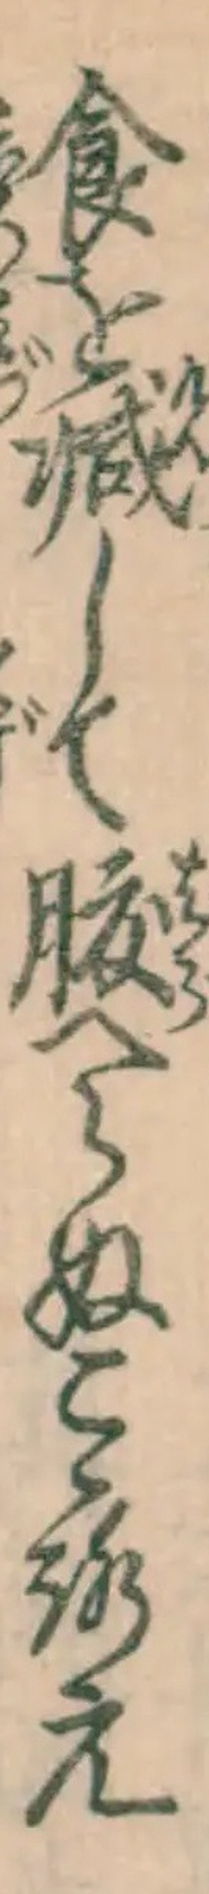食を減して腹へらぬこゝろえ
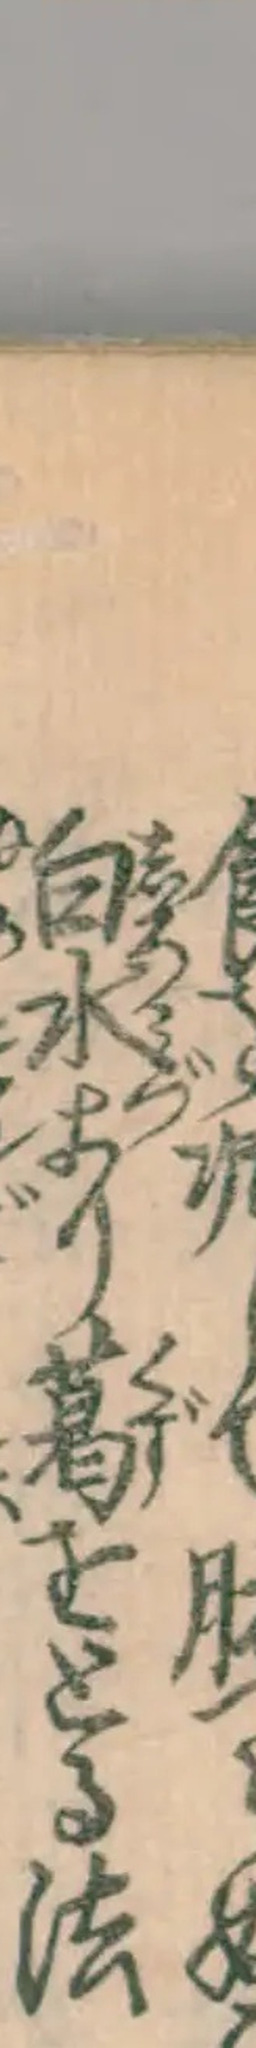白水より葛をとる法
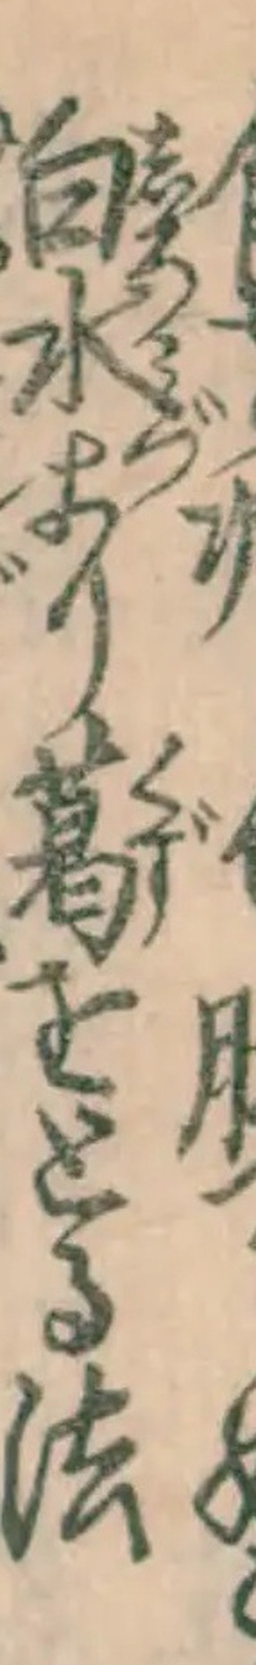白水より葛をとる法
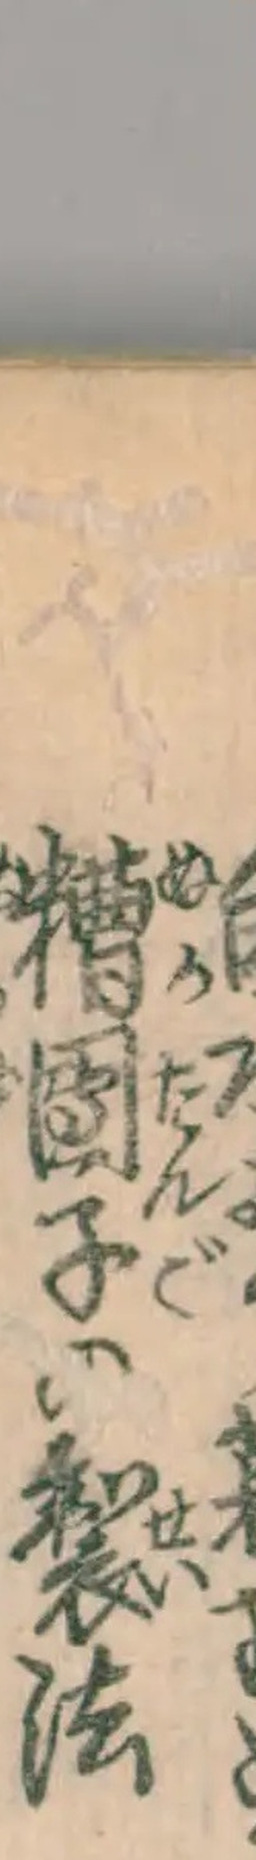糟団子の製法
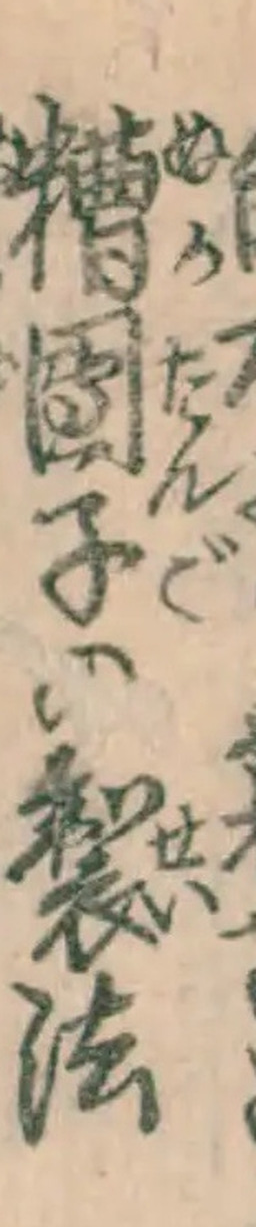糟団子の製法
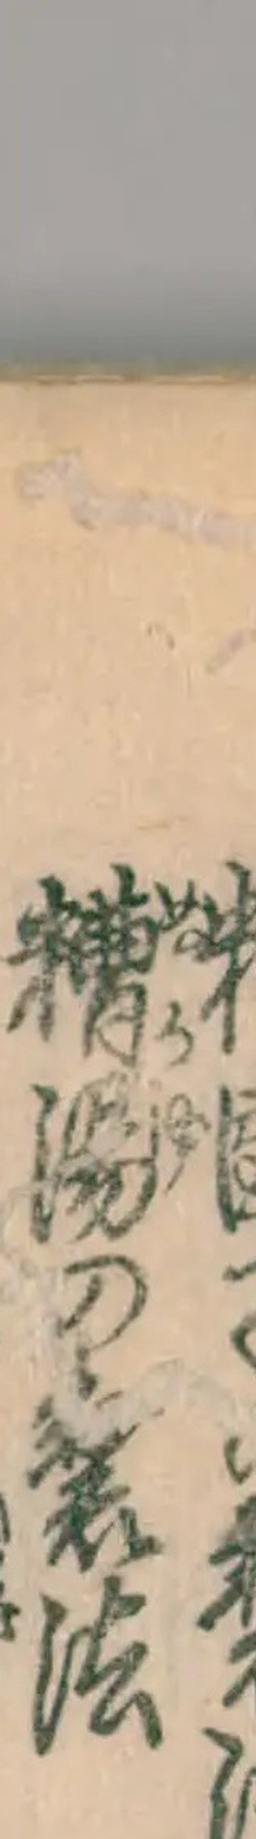糟湯の製法
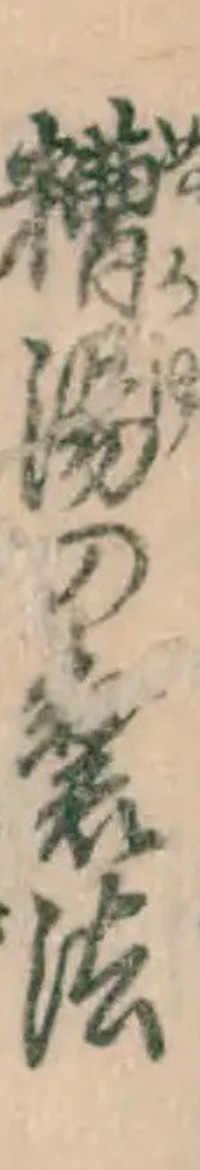糟湯の製法
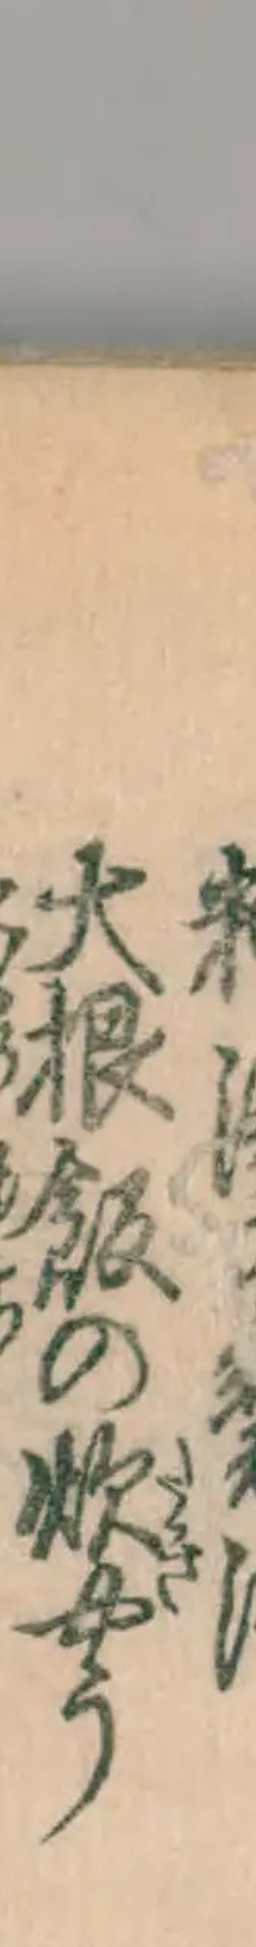大根飯の炊やう
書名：日ごとの心得
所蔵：国立国会図書館 National Diet Library, JAPAN
